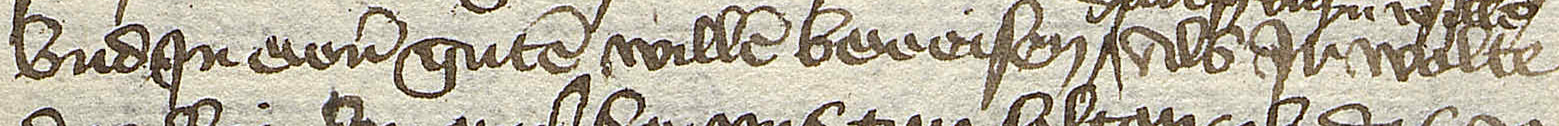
vnd In ewn* gute* wille* beweiſen Als Ir wolte
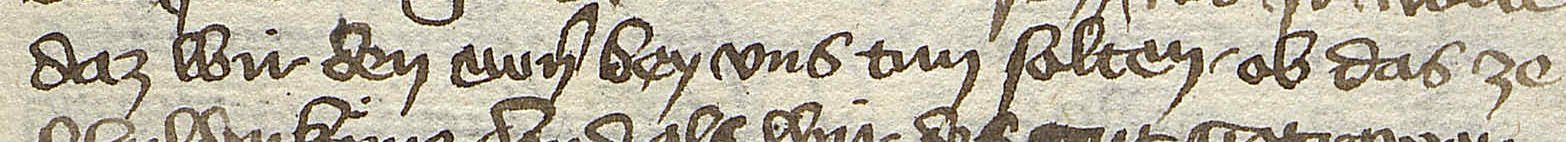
daʒ wir den ewn* bey vns tun ſolten / ob das ʒe
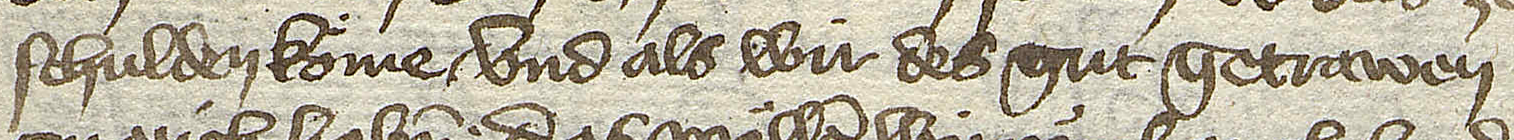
ſchulden köme / vnd als wir des gut getrawen
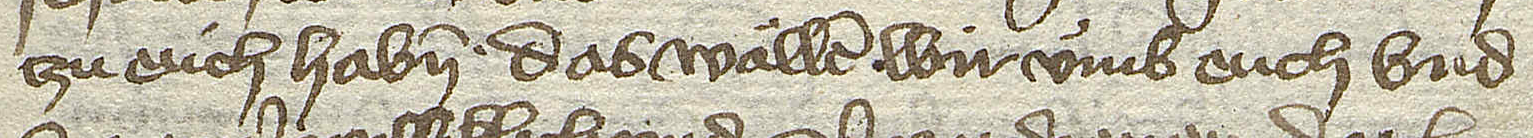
cʒu euch habn* . das wölle* wir v̈mb euch vnd
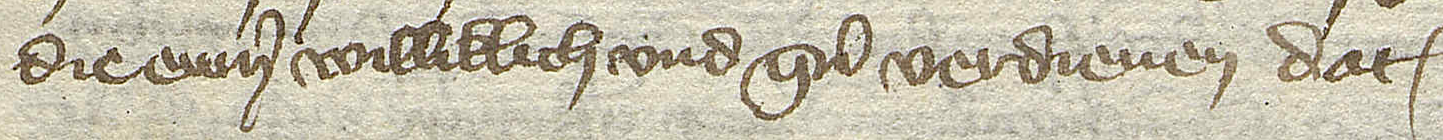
die ewn* williklich vnd gn* verdienen dat*
